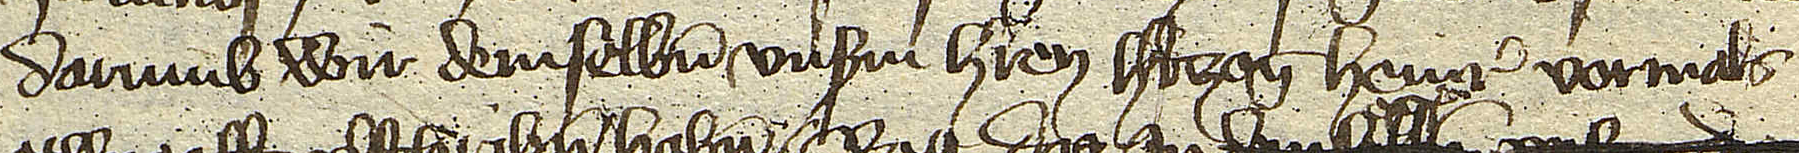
darumb wir demſelbn* vnſ*m h*ren h*rcʒog heinr* vormals
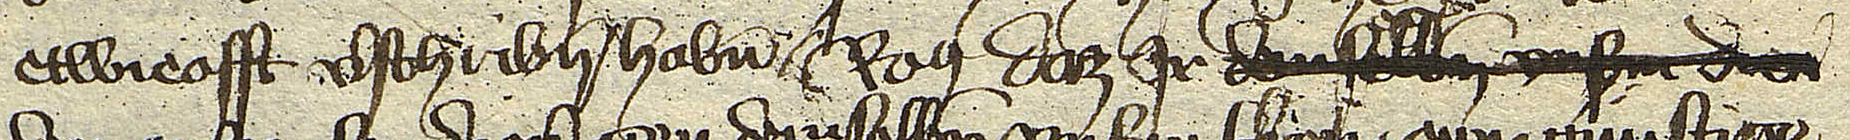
etwieofft v*ſchribn* habn* / Ro* daʒ Ir demſelbn* vnſ*m dien*
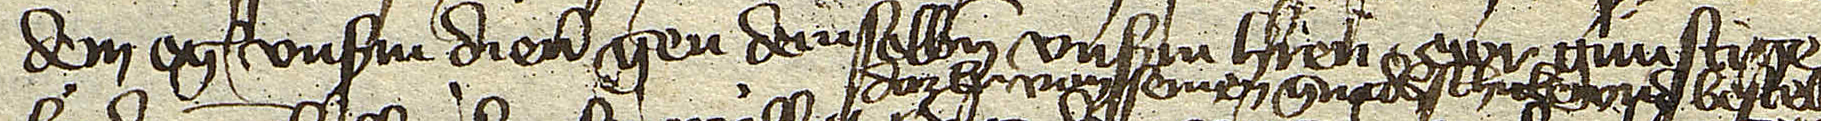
dem eg* vnſ*m dien* gen demſelbn* vnſ*m h*ren ewr günſtige
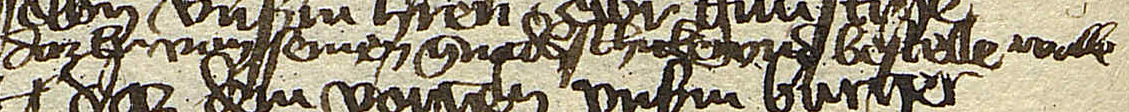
daʒ Er von ſeinen gnade* ſchicken vnd beſtelle wölle
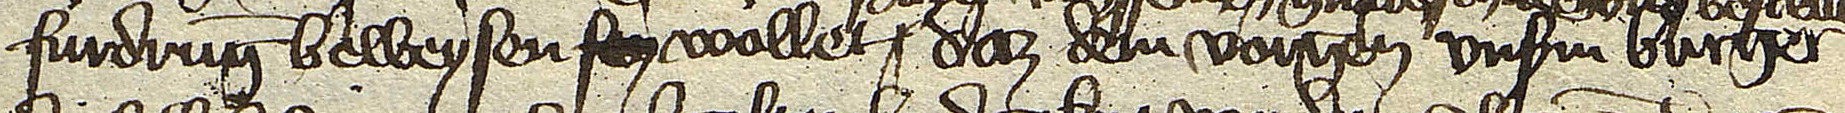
fürdrug* beweyſen ſey wöllet daʒ dem vorgen* vnſ*m burger
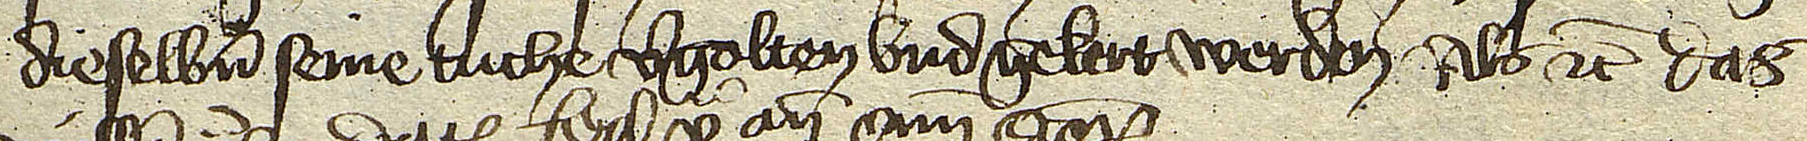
dieſelbn* ſeine tuche v*golten vnd gekert werden / Als ec* das
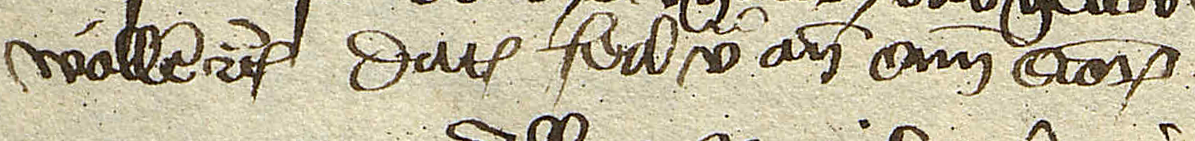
wölle* ec* Dat* fea* v* an* Omi* Sco*
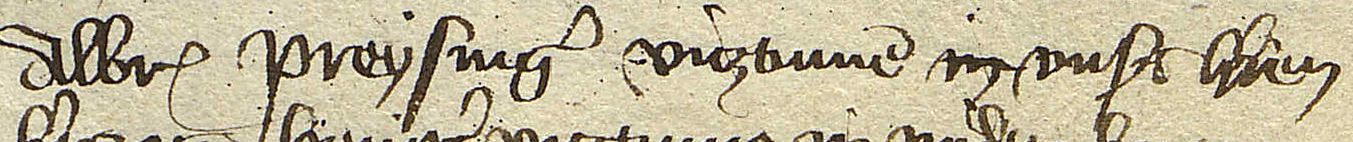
Albr* Preyſing* vicʒtume* in vnſ*s h*ren
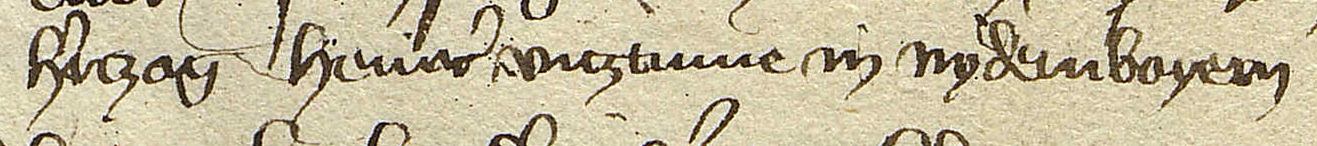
h*rcʒog heinr* vicʒtume in nydernbayern
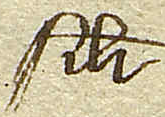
ſilr*
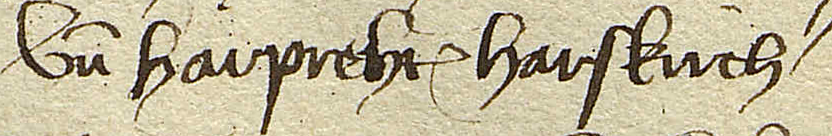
vn* harpreht* harſkirch*
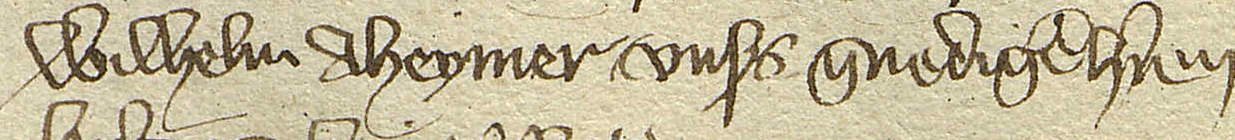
Wilhelm Aheymer / vnſ*s gnedige* h*ren
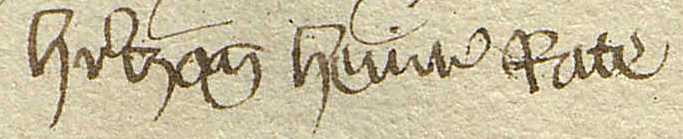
hr*cʒog heinr* Rate
